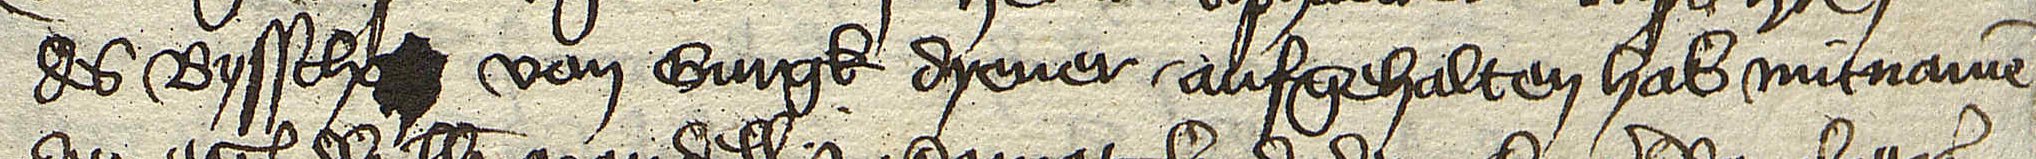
des Byſſcho%% von Gurgk dyener / aufgehalten hab mitname*
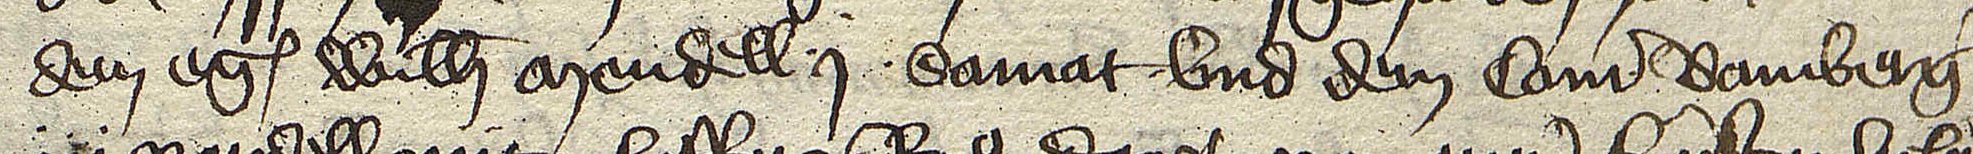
dem eg* wilh* Mendell . i . Samat . vnd dem Conr* Bamberg*
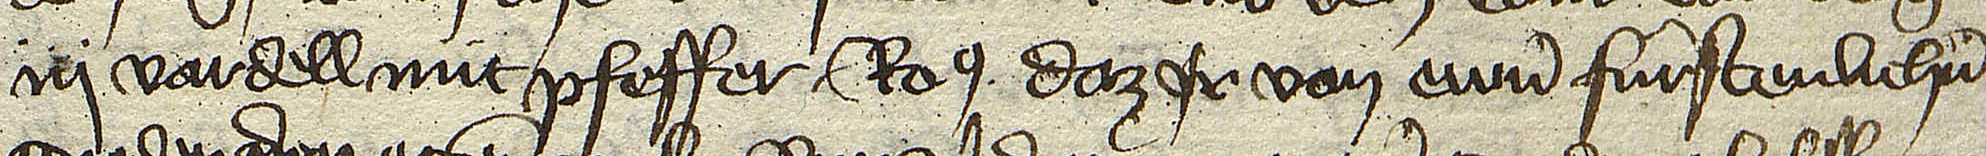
iii vardell mit pfeffer / Ro* . daʒ Ir von ewn* fürſtenlichn*
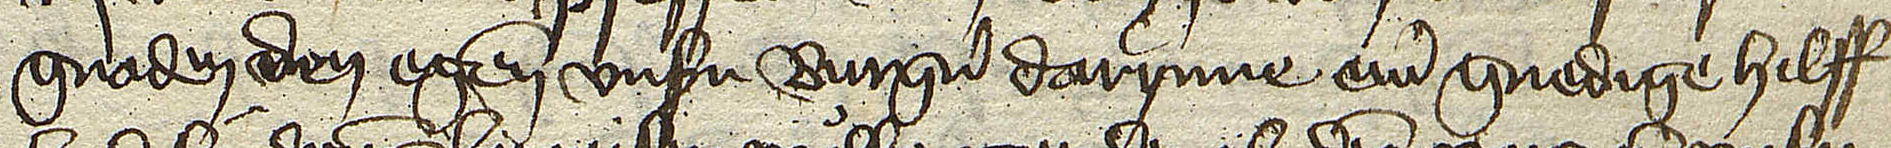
gnaden den egen* vnſ*n Burg*n darynne ew* gnedige hilff
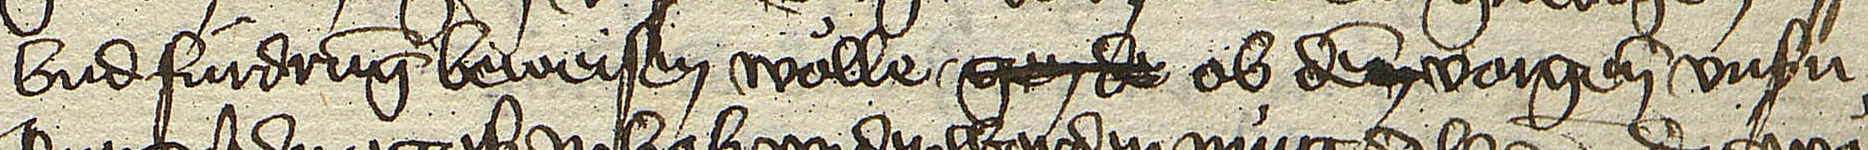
vnd fürdru*g beweiſen wölle / gen de ob de*n vorgen* vnſ*n
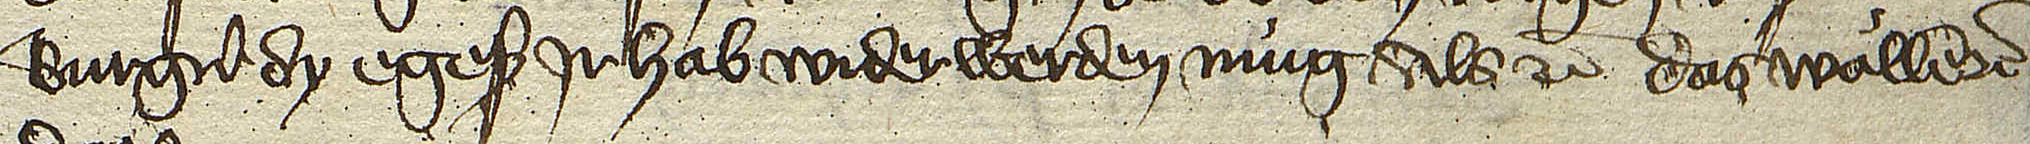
Burg*n dy egeſ* Ir hab widerwerden müg / Als ec* das wölle* ec*
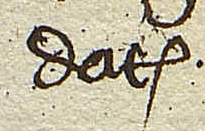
dat*
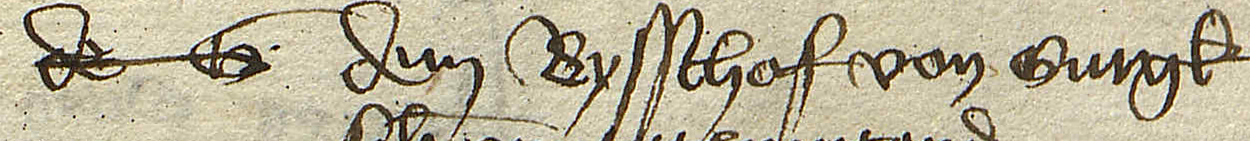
De G Dem Byſſchof von Gurgk
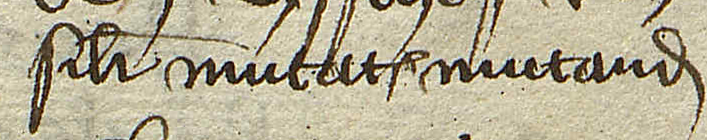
ſilr* mutat* mutand*
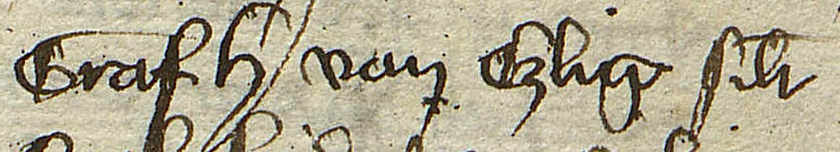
Graf H* von Cʒlig ſilr*
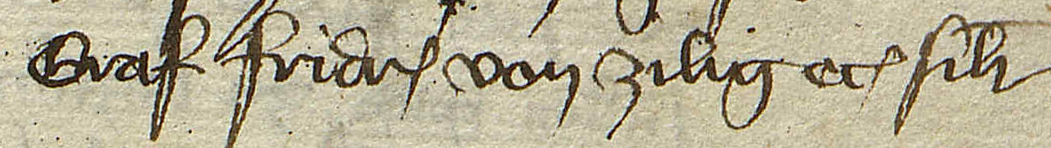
Graf fridr* von cʒilig ec* ſilr*
